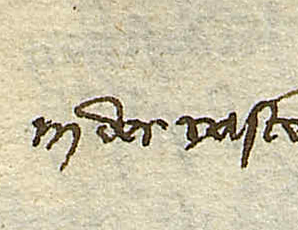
in der vaſte*
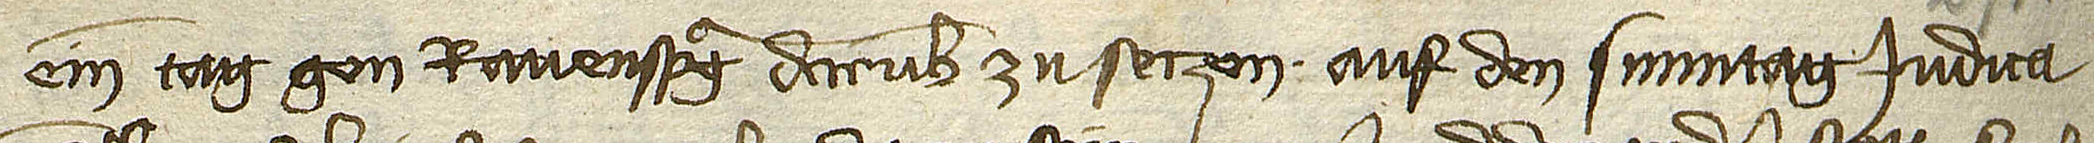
ein* tag gen Rauenſp*g darub* ʒu ſecʒen . auf den ſunntag Iudica
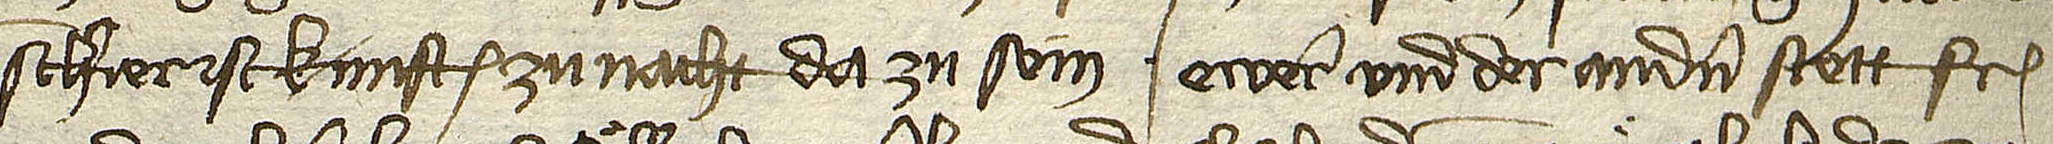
ſchieriſtkunft* ʒu nacht da ʒu ſein . ewer* vnd der and*n ſtett fr*
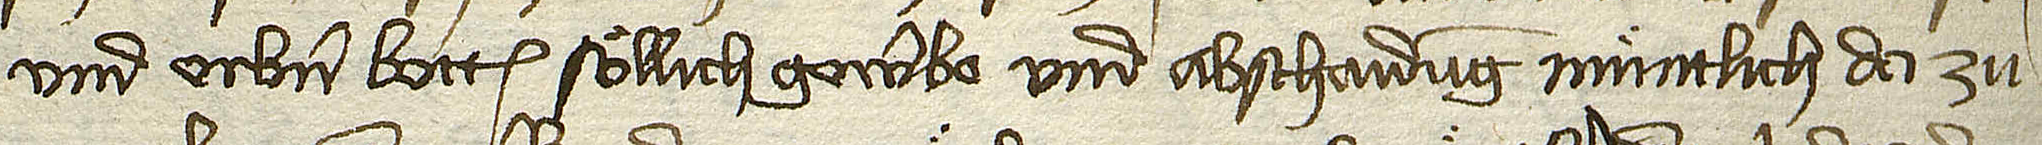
vnd erb*n bott* ſöllich gew*be vnd abſchaidu*g müntlich da ʒu
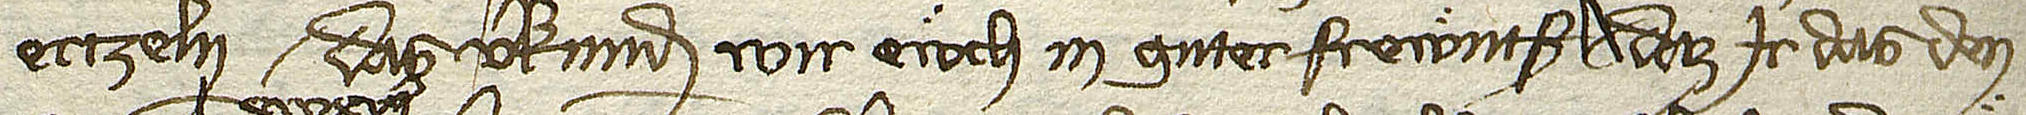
ercʒeln / Das v*kund* wir eẅch in guter freẅntſ* / daʒ Ir das den
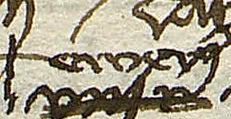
ewer*
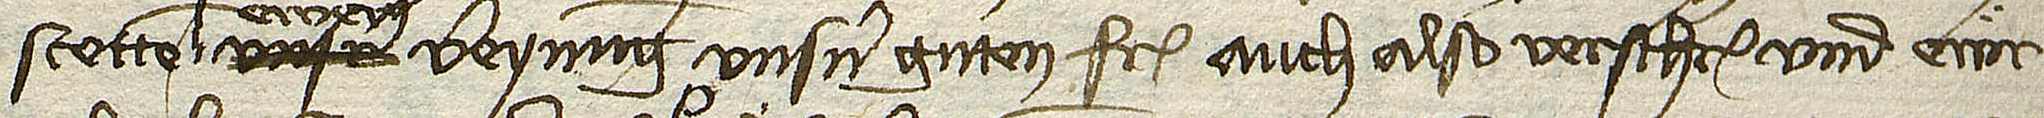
ſtette* vnſ*r v*eynu*g vnſ*n guten fr* auch alſo verſchr* vnd eẅr
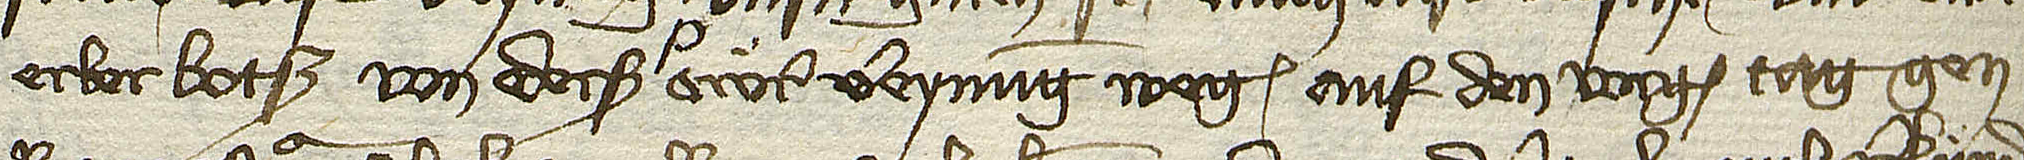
erber botſ* von derſ* eẅ*r v*eynu*g weg* auf den vorg* tag gen
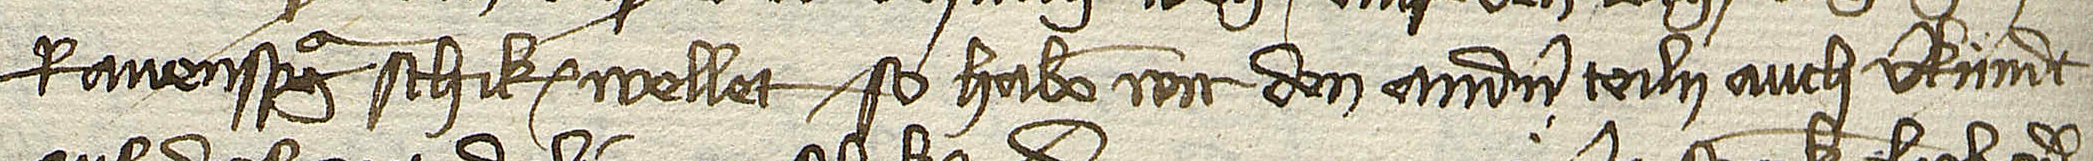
Rauenſp*g ſchik* wellet / ſo habe* wir den and*n teiln auch v*kündt
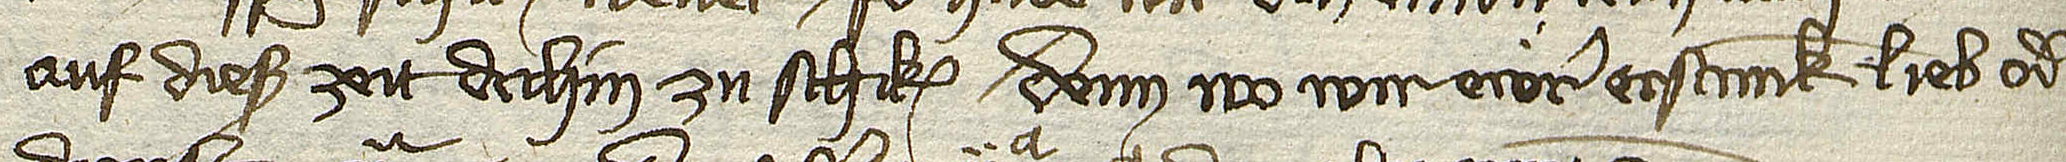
auf dieſ* ʒeit dahin ʒu ſchik* / Denn wo wir eẅ*r erſamk* lieb od*
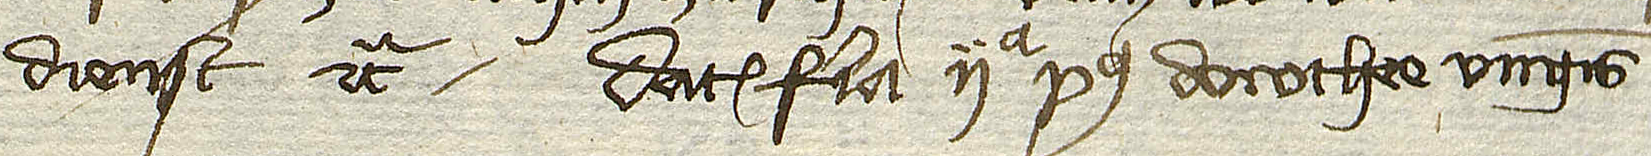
dienſt ec* / Dat* f*ia ii* p* dorothee virg*is
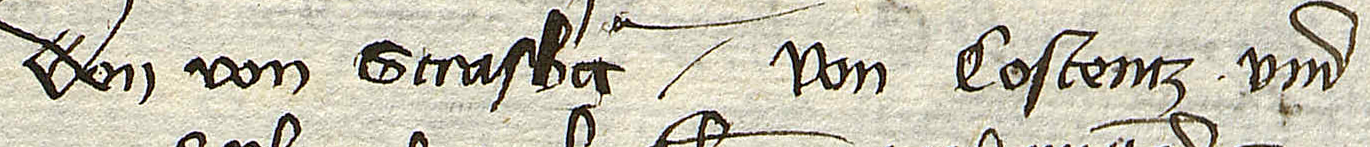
Den von Straſb*g / von Coſtencʒ . vnd
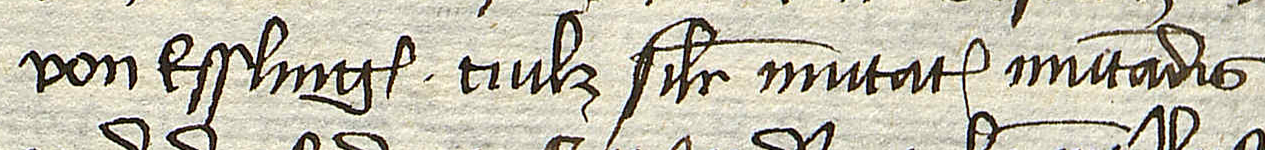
von Eſſling* . cuil* ſilr* mutat* muta*dis
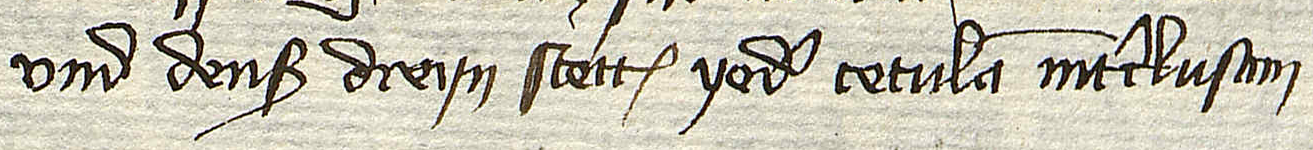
vnd denſ* dreyn ſtett* yed* cetula* int*cluſam
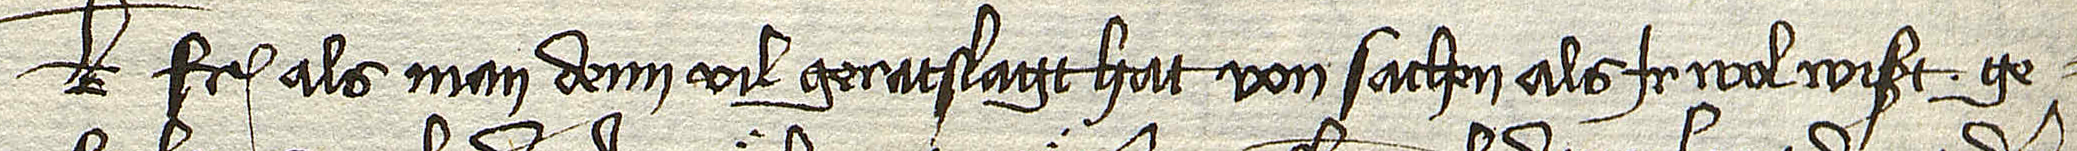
L* fr* als man denn vil geratſlagt hat von ſachen als Ir wol wiſʒt . ge =
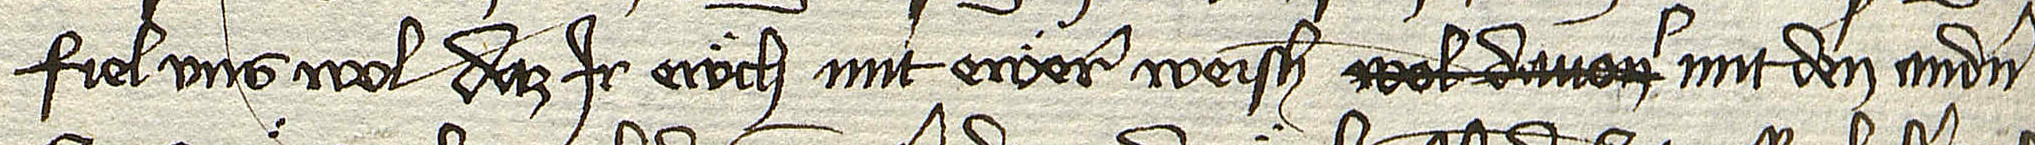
fiel vns wol daʒ Ir eẅch mit eẅer* weiſh* wol dauon mit den and*n
